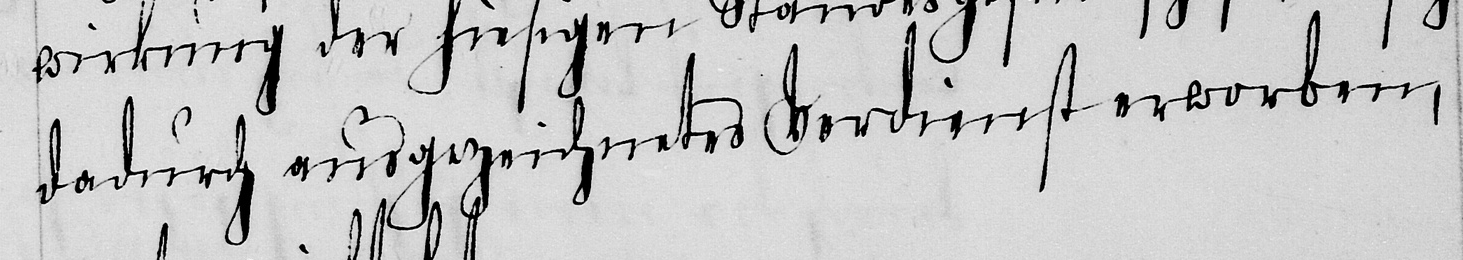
dadurch ausgezeichnetes Verdienst erworben,
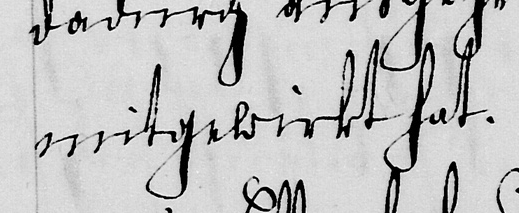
mitgewirkt hat.
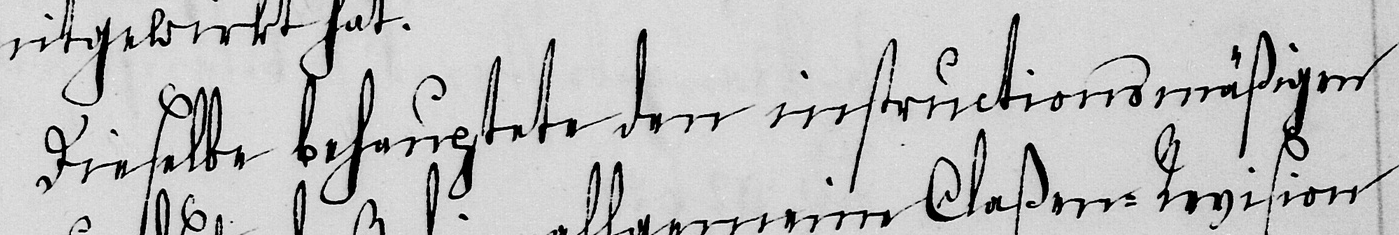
Dieselbe behauptete den instructionsmäßigen
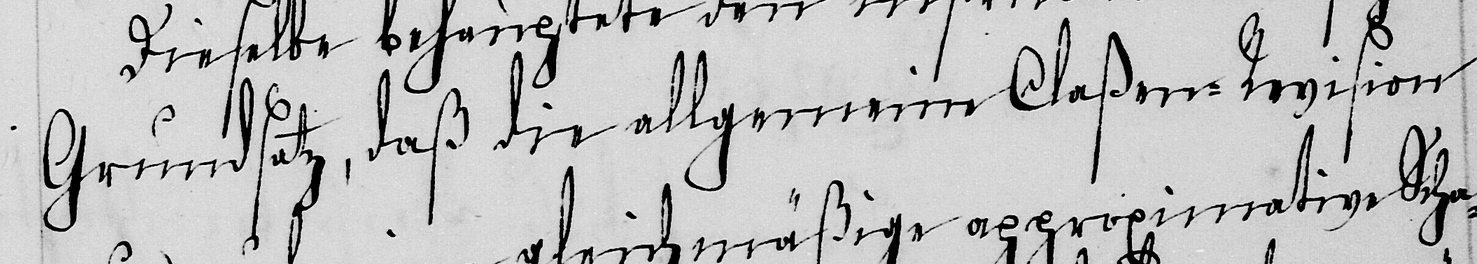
Grundsatz, daß die allgemeine Claßen-Revision
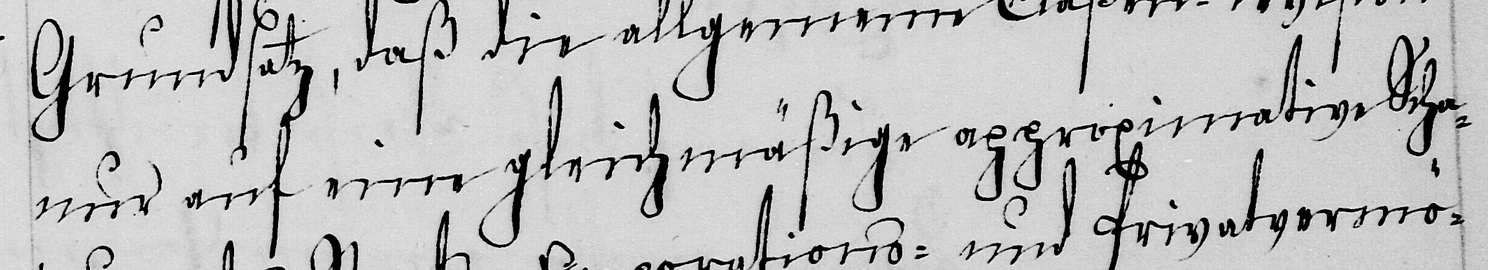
nur auf eine gleichmäßige approximative Scha¬
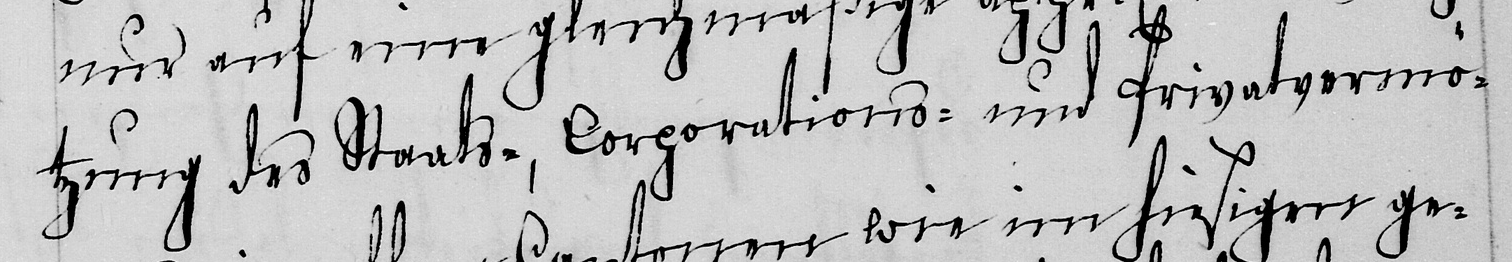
tzung des Staats-, Corporations- und Privatvermö¬
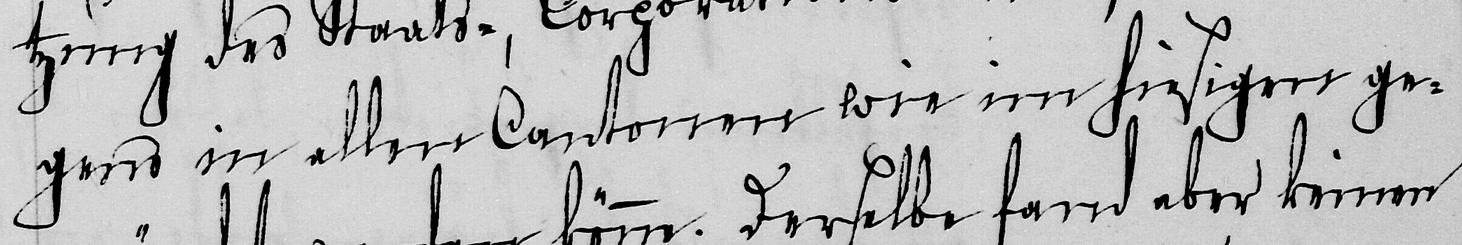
gens in allen Cantonen wie im hiesigen ge¬
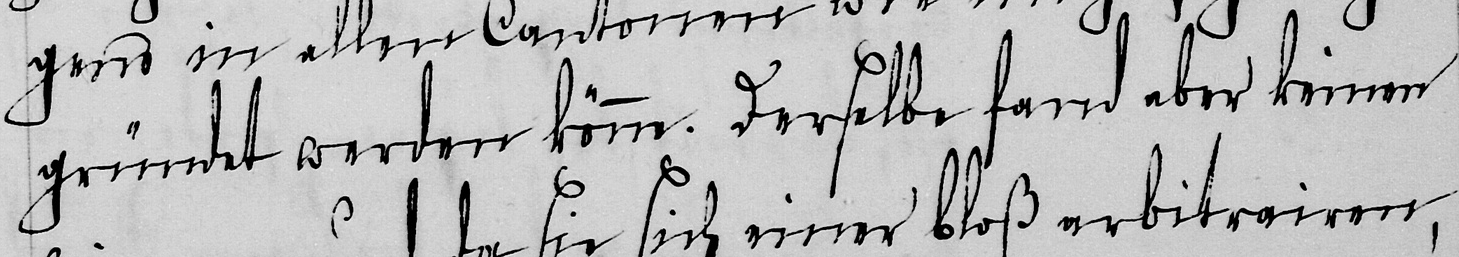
gründet werden könne. Derselbe fand aber keinen
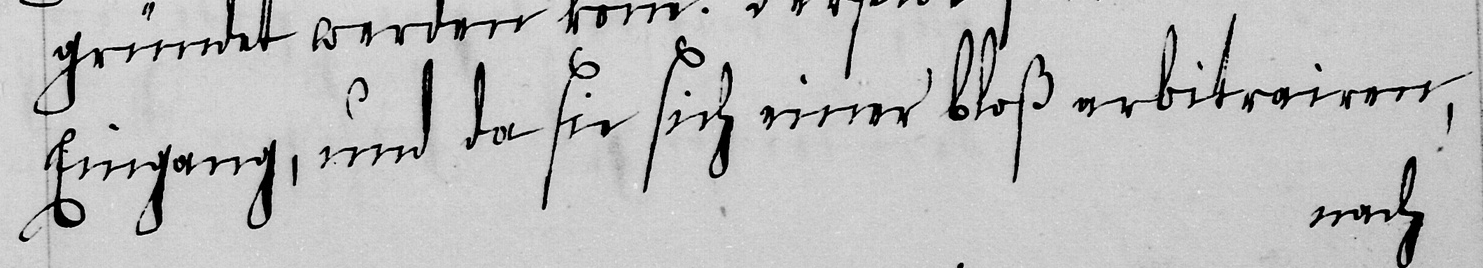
Eingang, und da sie sich einer bloß arbitrairen,
